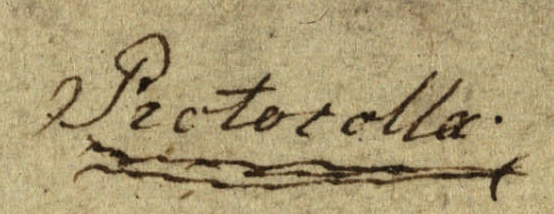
Protocolla
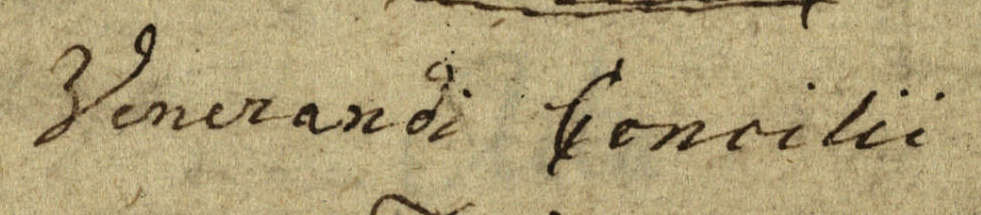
Venerandi Concilii
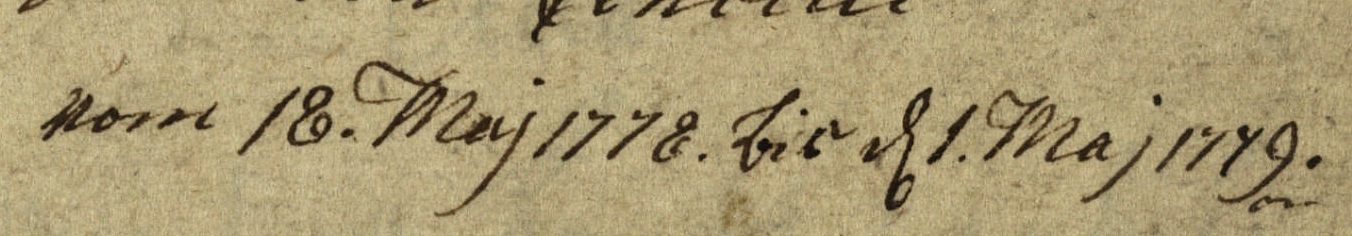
vom 18. Maj 1778. bis d 1. Maj 1779
